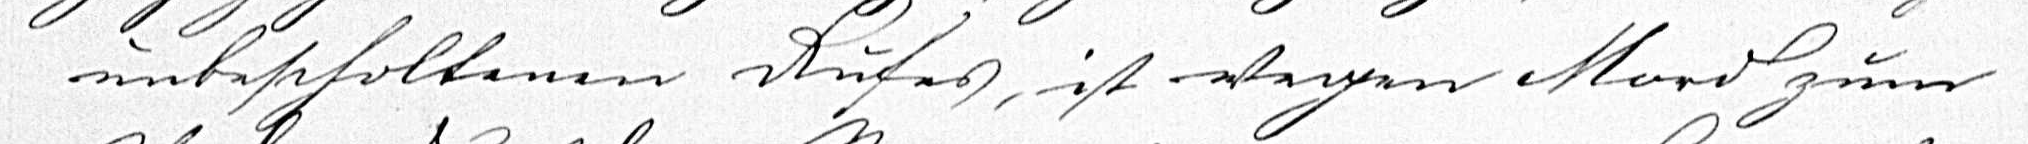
bescholtenen Rufes, ist wegen Mord zum Tode
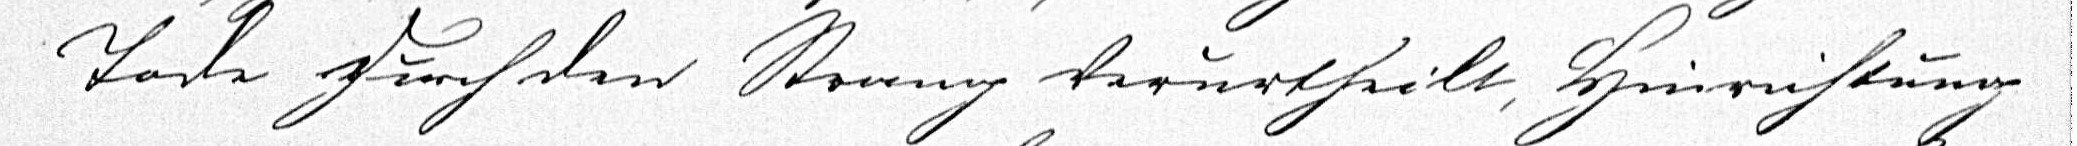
durch den Strang verurtheilt. Hinrichtung ist
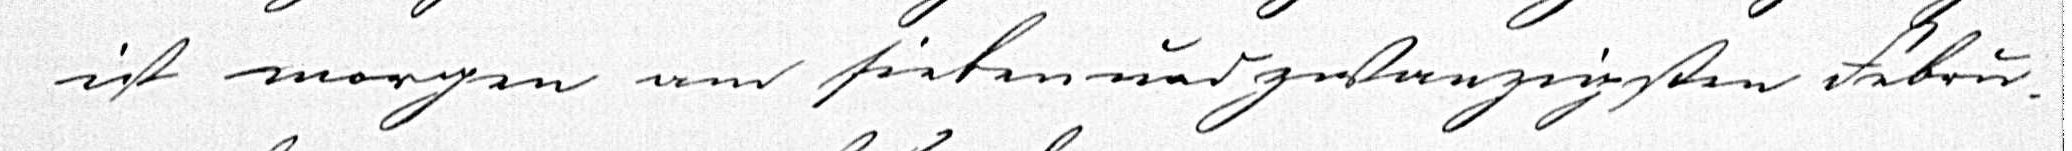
morgen um sieben und zwanzigsten Februar
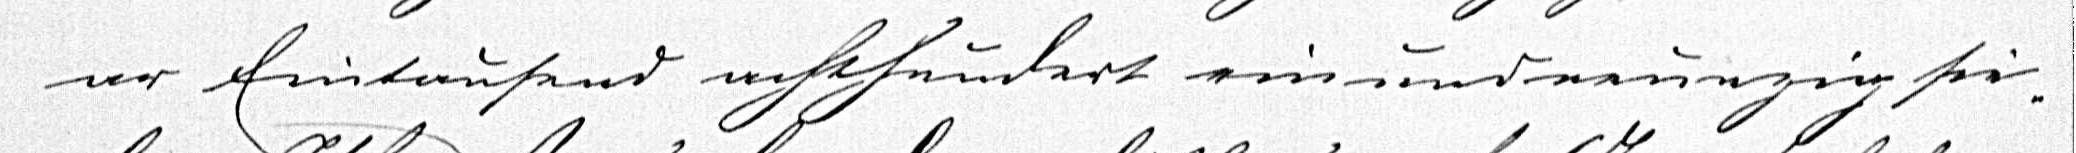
Eintausend achthundert einundneunzig sie¬
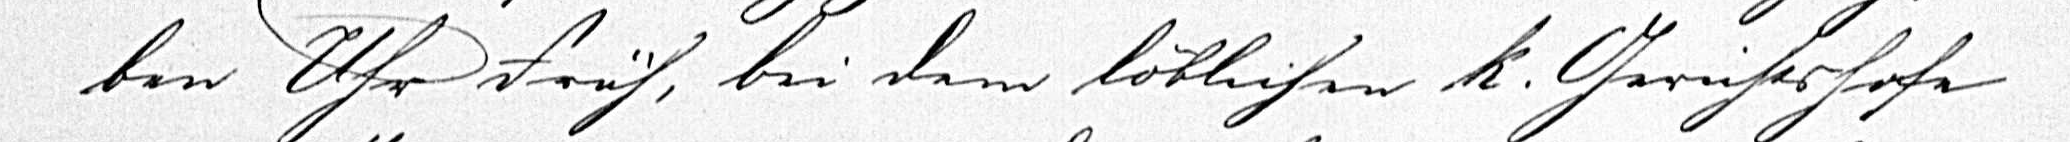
ben Uhr früh, bei dem löblichen k. Gerichtshofe in
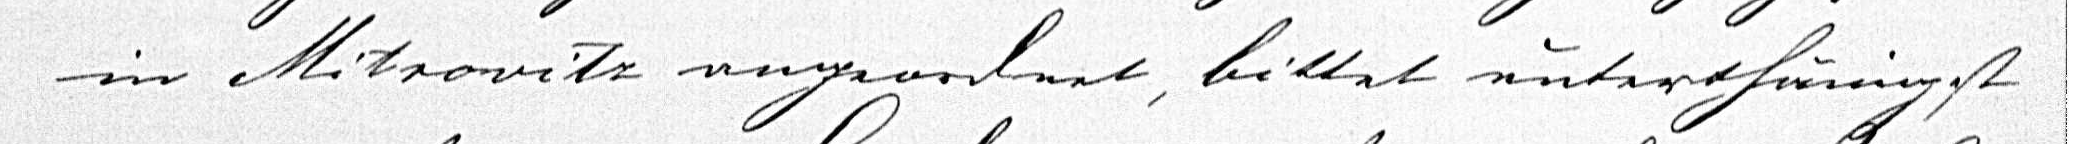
Mitrovitz angeordnet, bittet unterthänigst
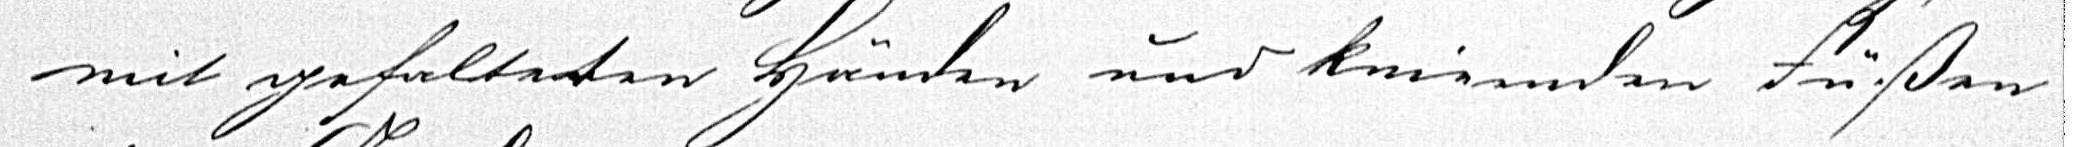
mit gefaltenen Händen und knienden Füßen
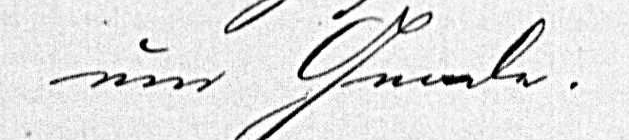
um Gnade.
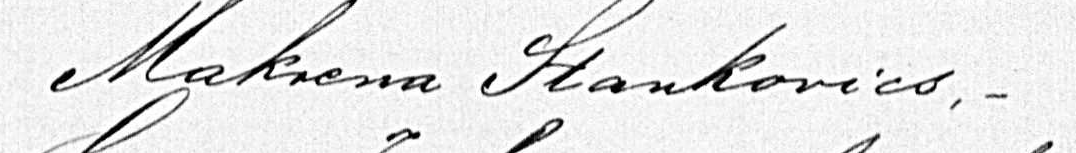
Makrena Stankovits
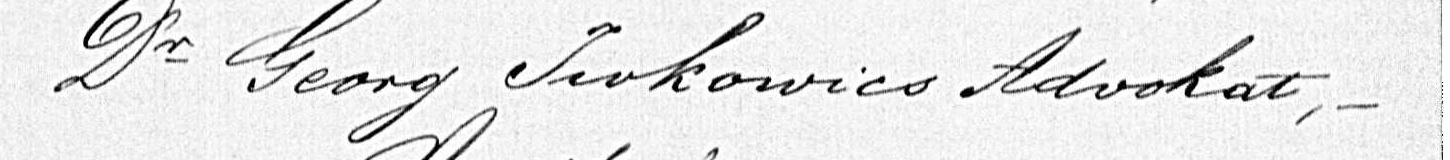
Dr. Georg Iwkowics Advokat, –
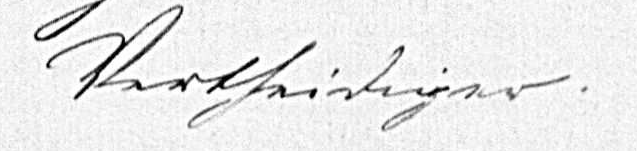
Vertheidiger
